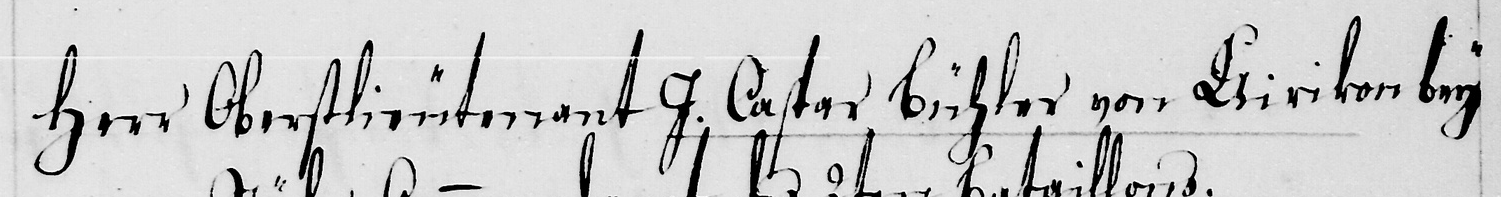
Herrn Oberstlieutenant J. Caspar Büchler von Uirikon bey
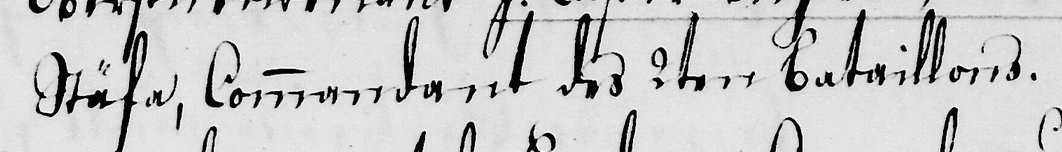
Stäfa, Commandant des 2ten Bataillons.
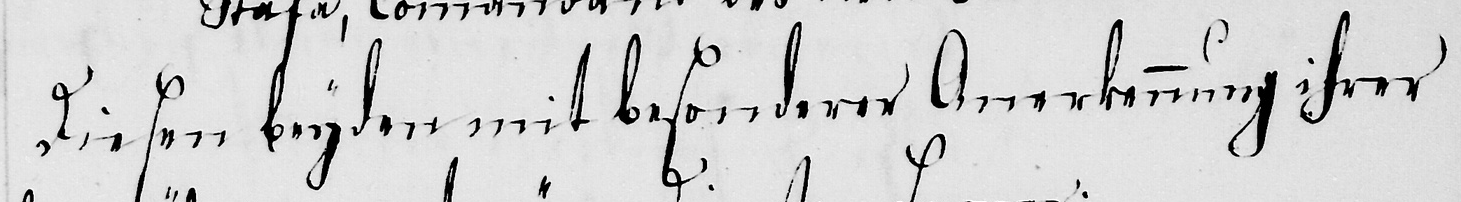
Diesen beyden mit besonderer Anerkennung ihrer
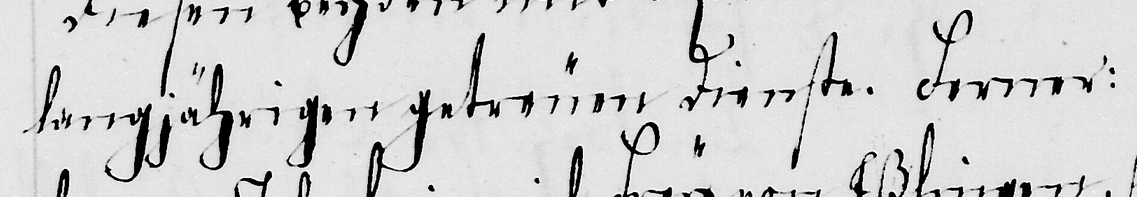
langjährigen getreuen Dienste. Ferner:
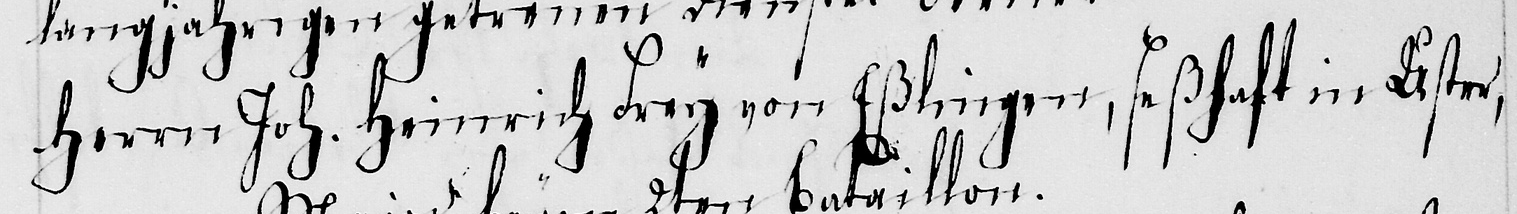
Herrn Joh. Heinrich Frey von Eßlingen, seßhaft in Uster,
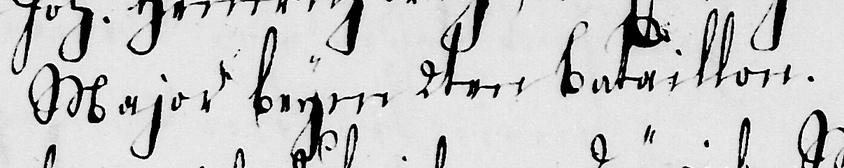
Major beym 2ten Bataillon.
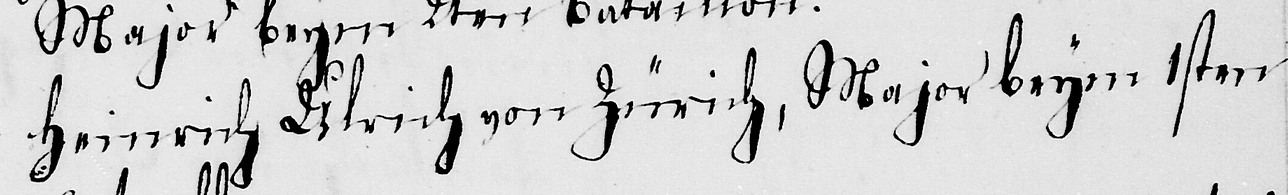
Heinrich Ulrich von Zürich, Major beym 1sten
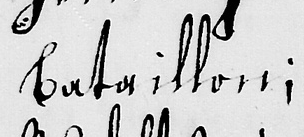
Bataillon;
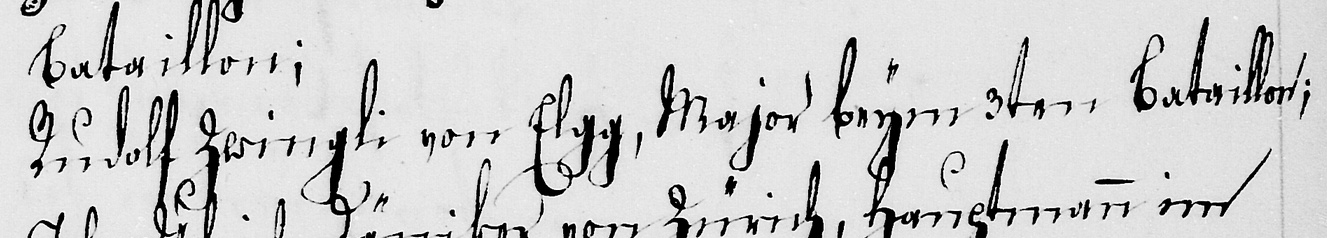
Rudolf Zwingli von Elgg, Major beym 3ten Bataillon;
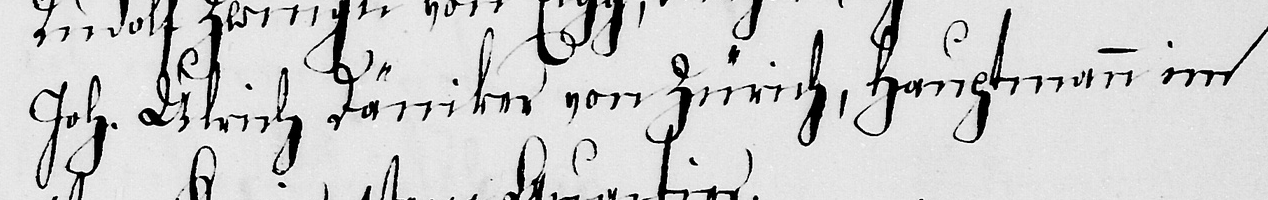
Joh. Ulrich Däniker von Zürich, Hauptmann im
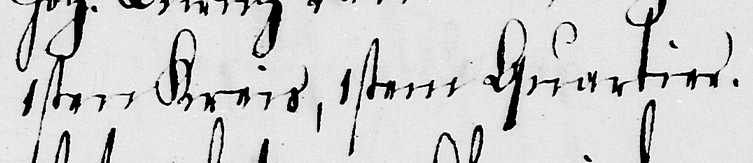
1sten Kreis, 1sten Quartier.
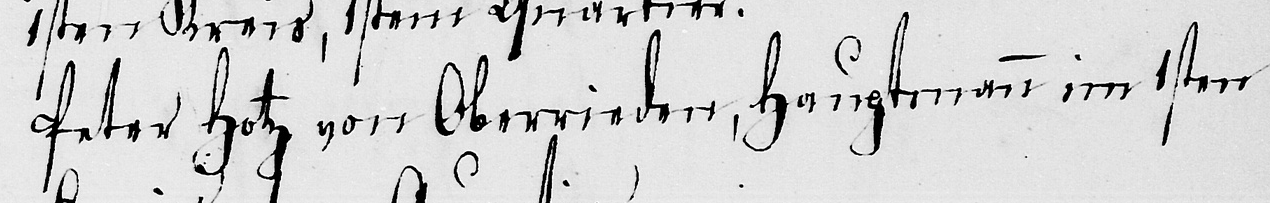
Peter Hotz von Oberrieden, Hauptmann im 1sten
